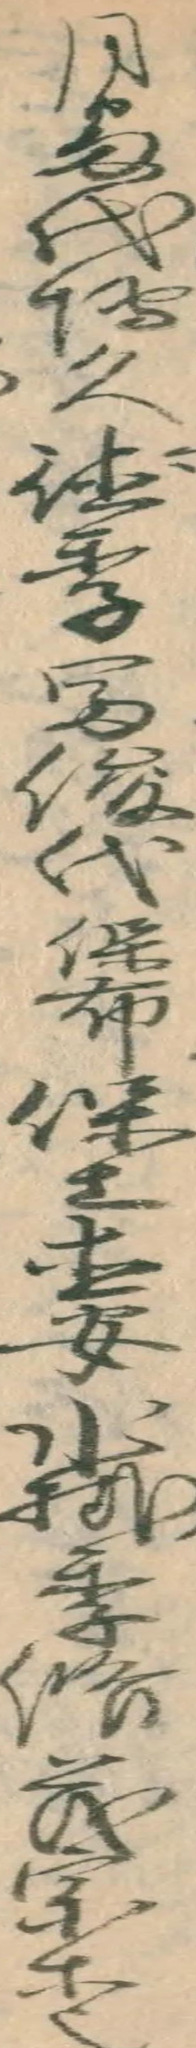月番代博久徳季冨俊代保布保土直安水掛季脩茂宗等也
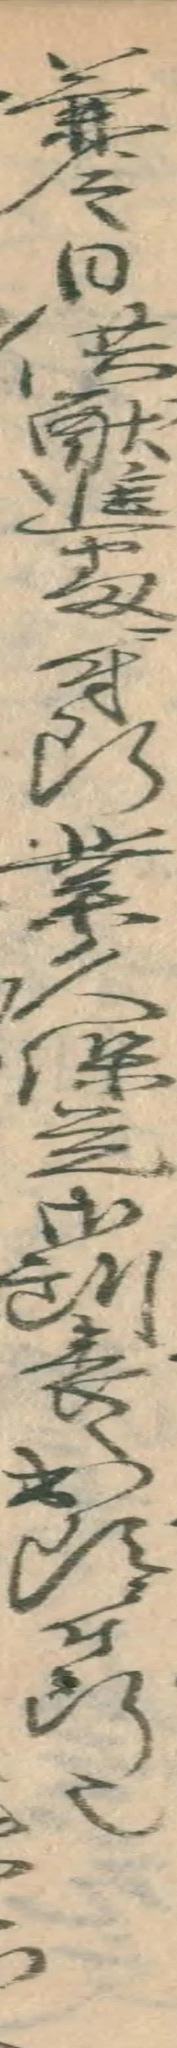兼令日供献進番ニ付断業久保覚御所表へ出頭ニ付断也
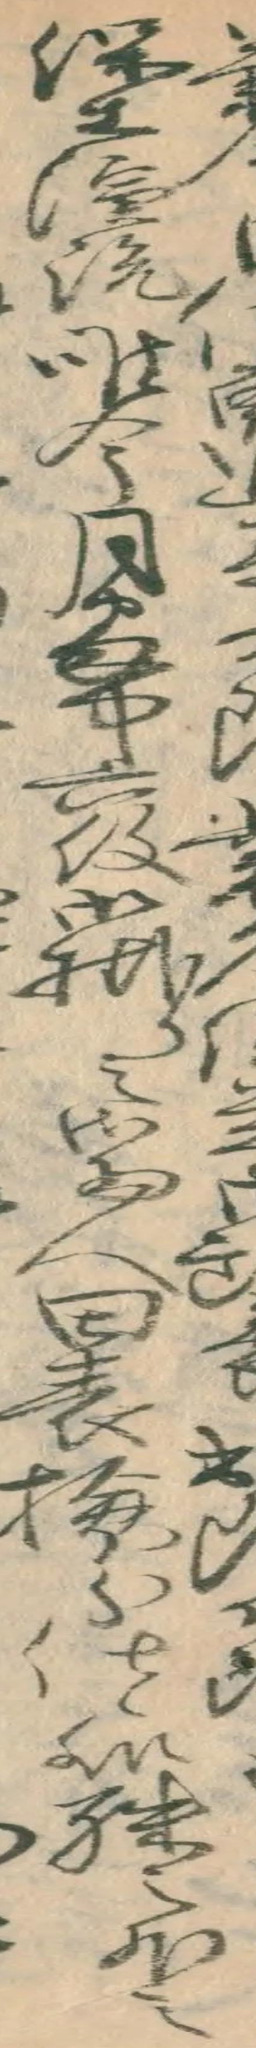保土演説唯今月番中六役御掛り之御両人田表検分仕候処殊之外之
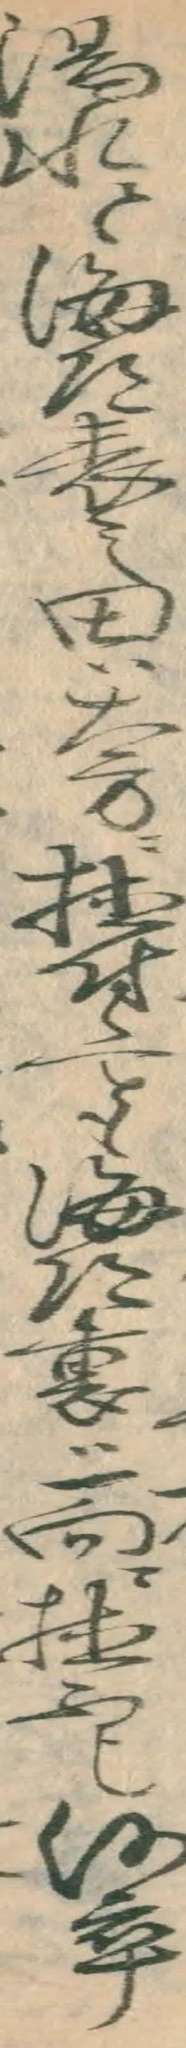渇水ニ候海道表之田ハ大方ニ植付候へとも海道裏ハ一向ニ植不申候何卒
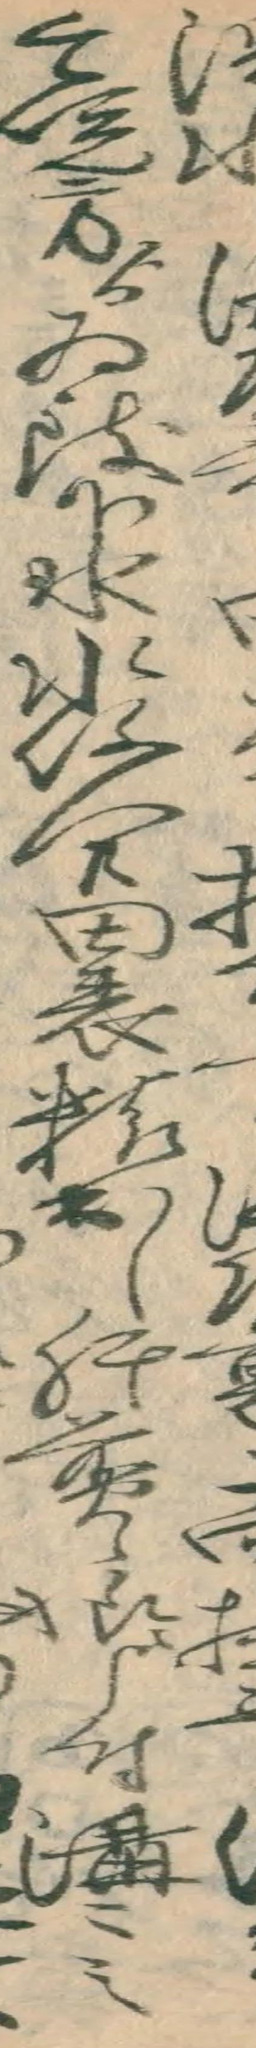今晩方ゟ為致下水役人共田表精出し肝煎候様ニ申付溝々之
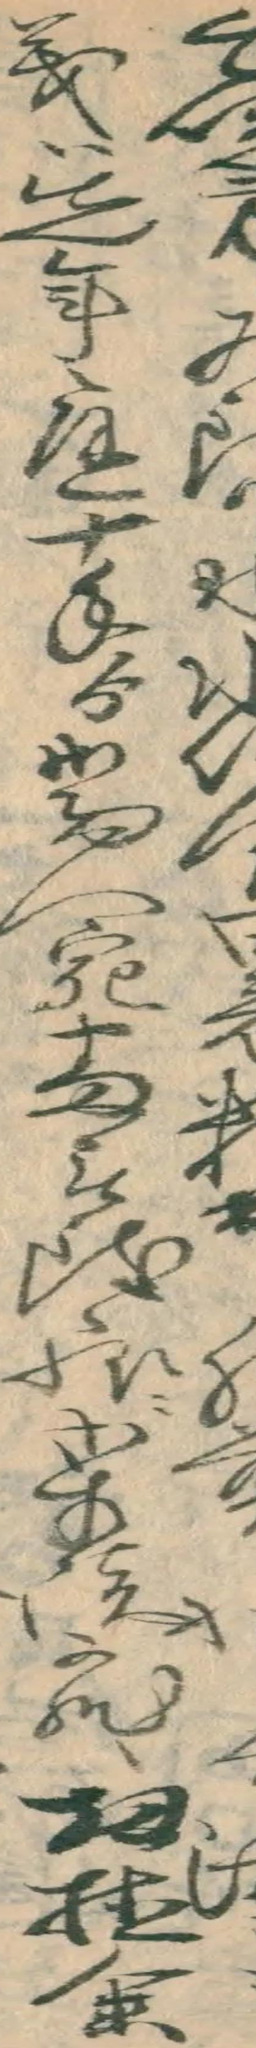義ハ先年之通十手ゟ御両人宛番被致候様ニ御相談可然候扨植余
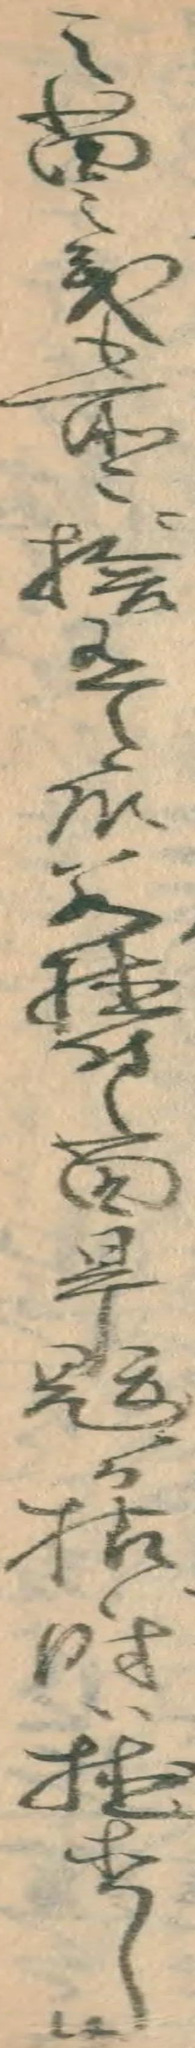之苗之義も所々ニ捨有之候故若植付之苗旱魃ニ而枯候時ハ植直し候

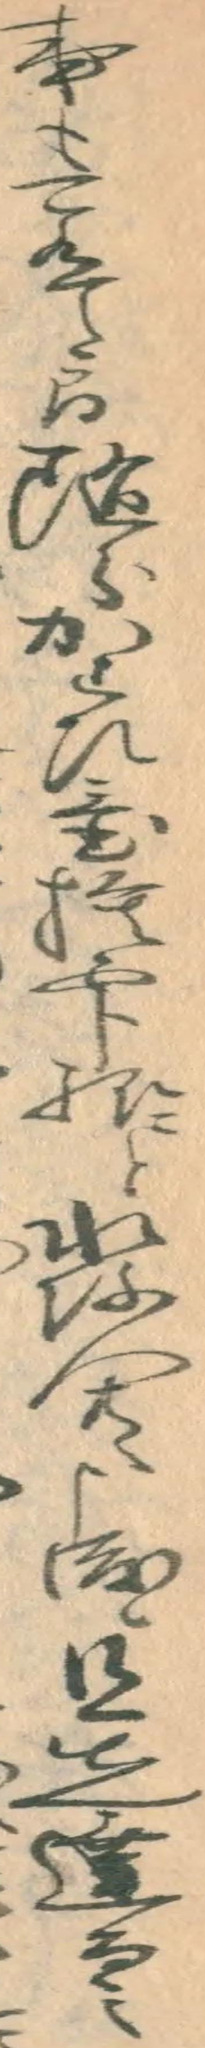事も可有之候間随分かこひ置捨不申様ニと水役人共へ申渡候且先達而之
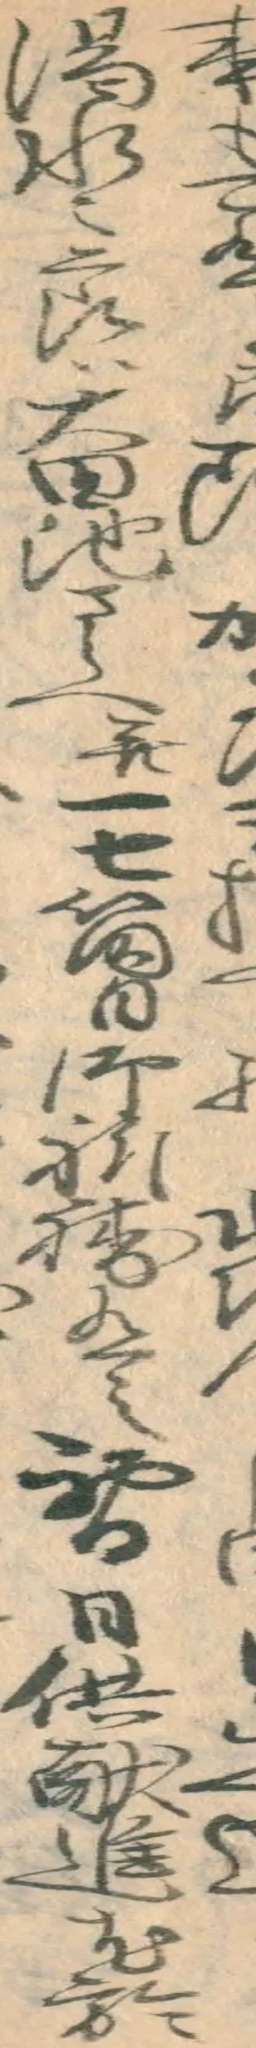渇水之節ハ大田池さらへ并一七筒日御祈祷有之初日日供献進尤於
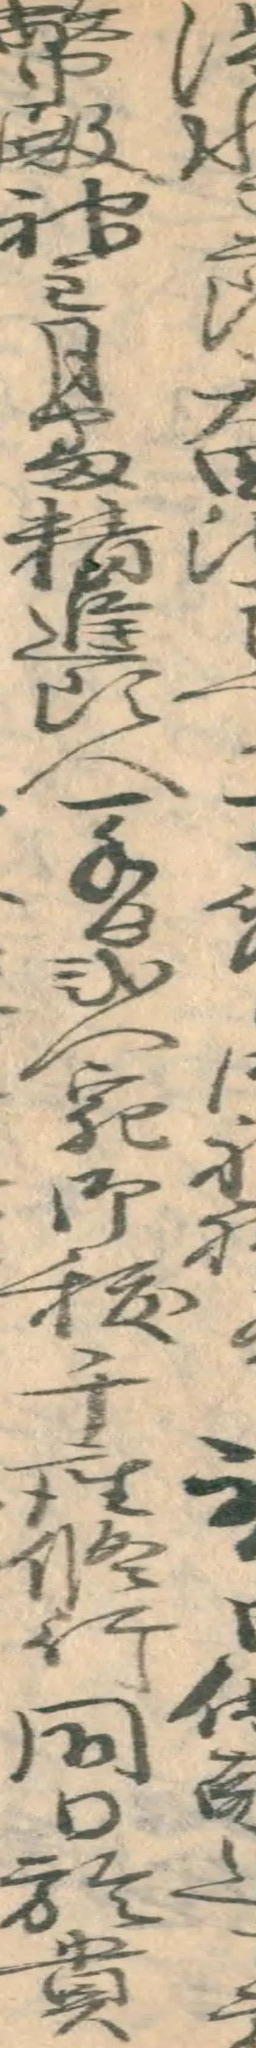幣殿神主月番精進頭人一手ゟ弐人宛御祓千座修行同日於貴
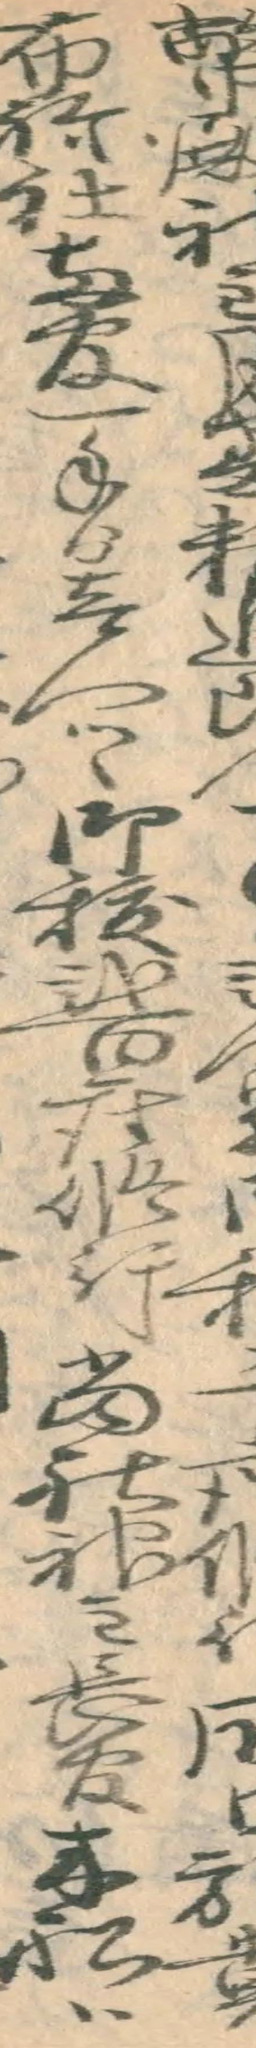布祢社両官一手ゟ壱人ツヽ御祓弐百座修行当社神主長官木船ハ
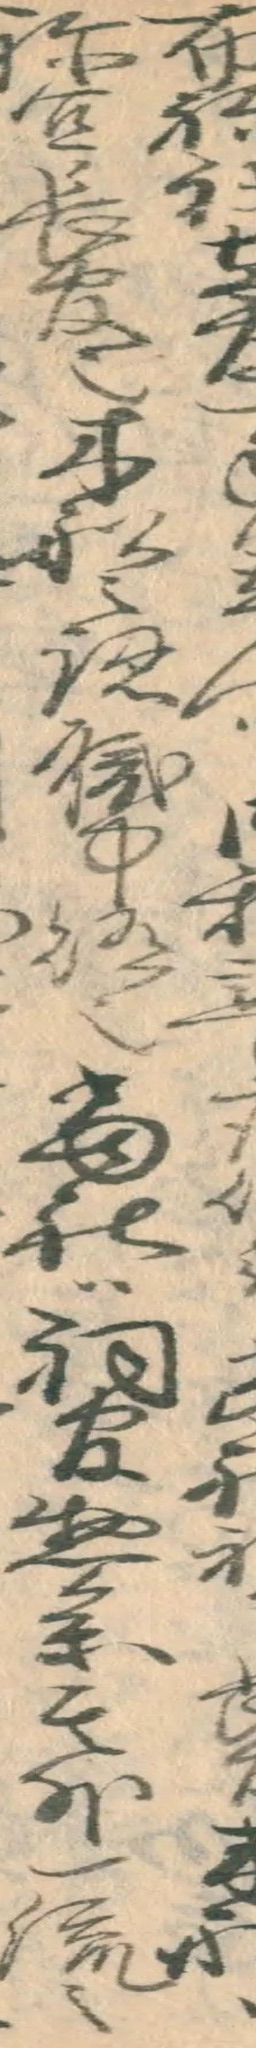祢宜長官也木船之認職中賄也当社ハ祠官惣兵衛其外一統之
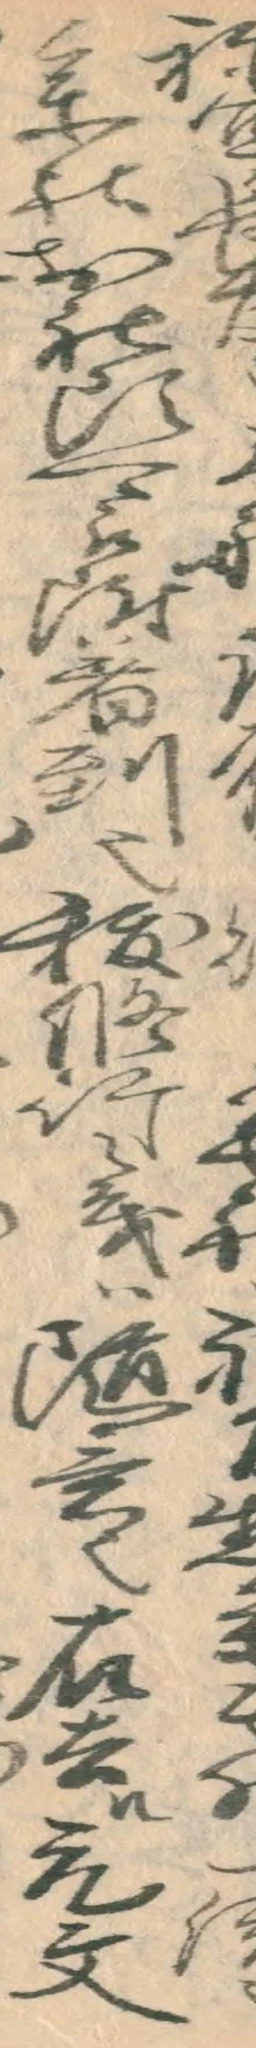参社於社頭可被付着到也祓修行之義ハ随意也右去ル元文
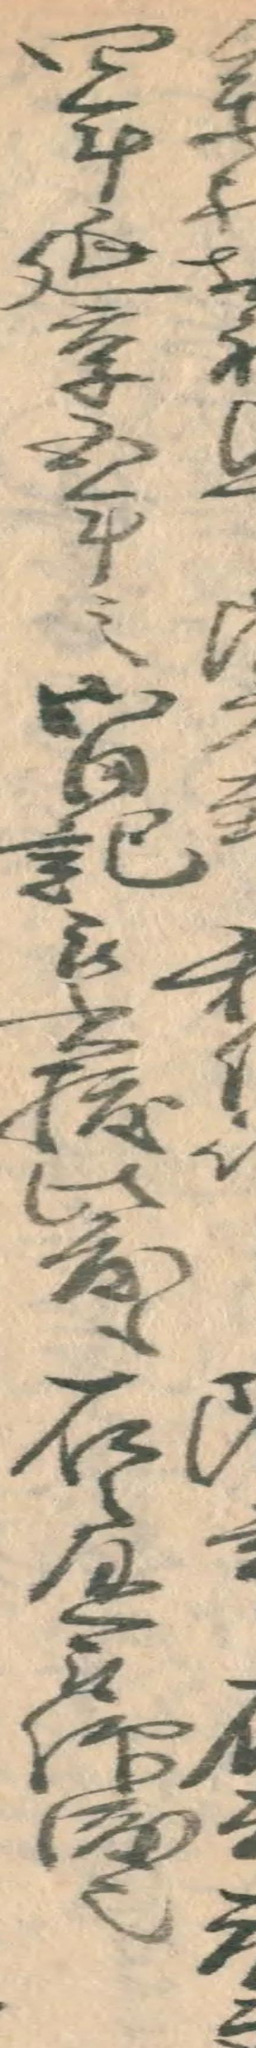四年延享五年之御日記被書抜此度も右之通被仰渡也
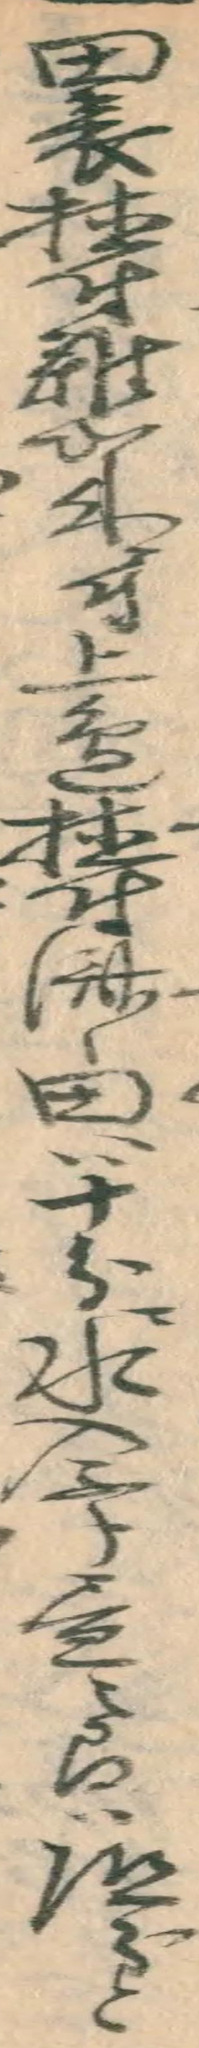一田表植付難出来ニ付上辺植付済候田へハ十分ニ水入不申昼之間ハ随分と
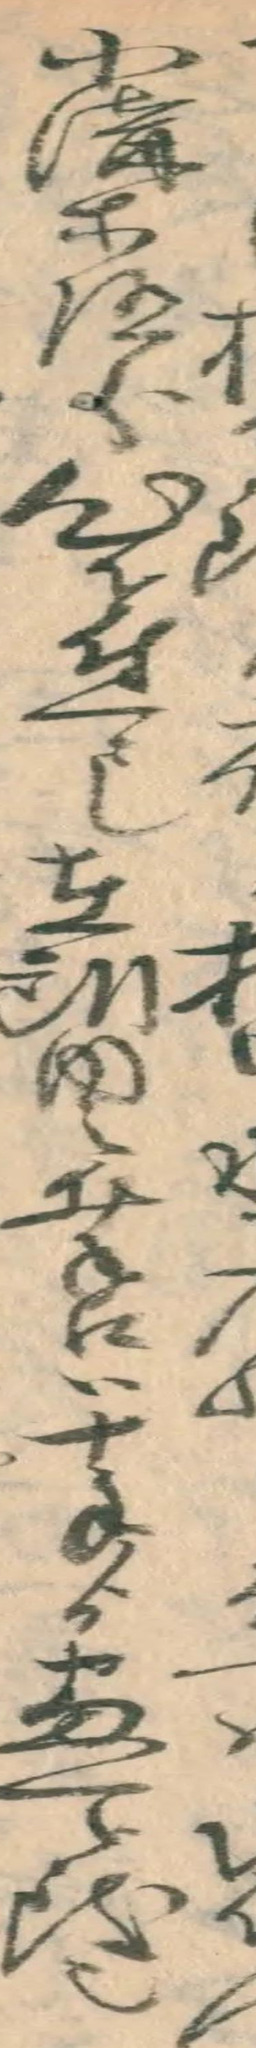小溝等随分心を付可申候在所内之井手口ハ十手ゟ番可被致也
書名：賀茂社記録. 第58冊
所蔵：国立国会図書館 National Diet Library, JAPAN
